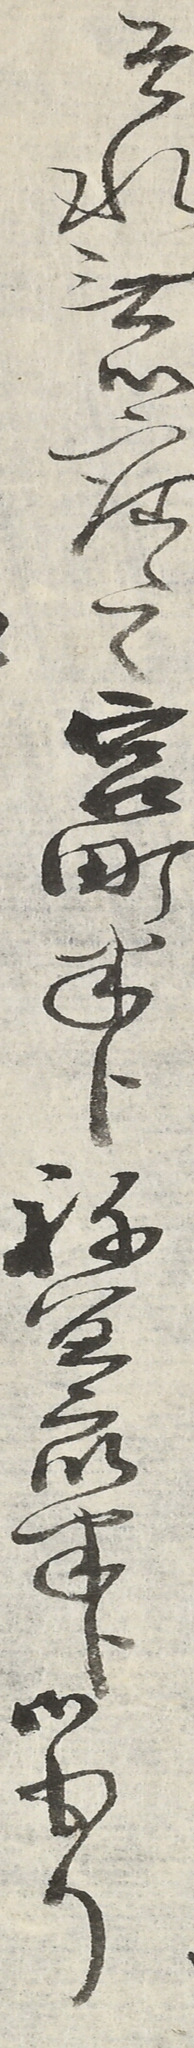それ無御座候ハヽ宮町半分祢宜衆半分御もり
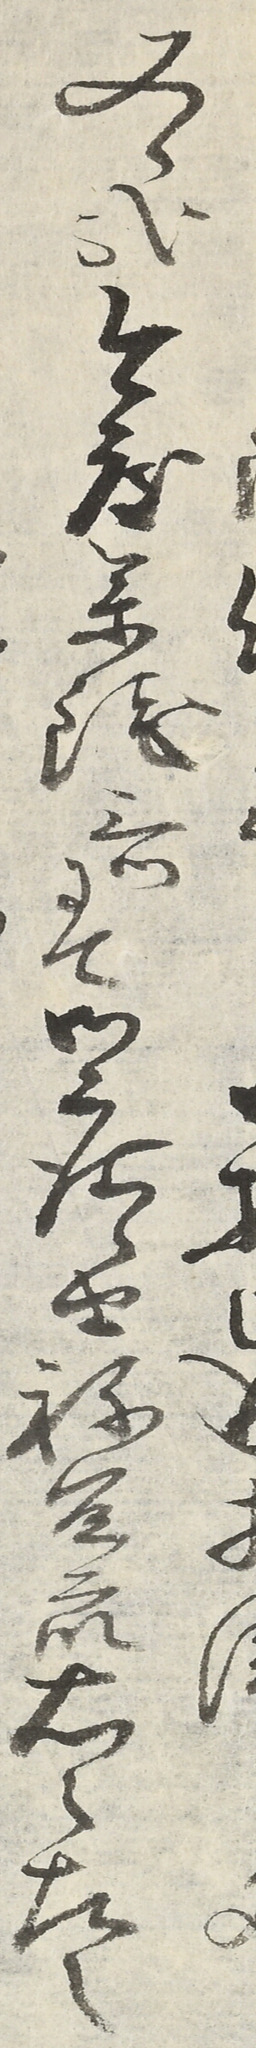又候哉今度参銭三ツにて御座候由祢宜衆右之左之
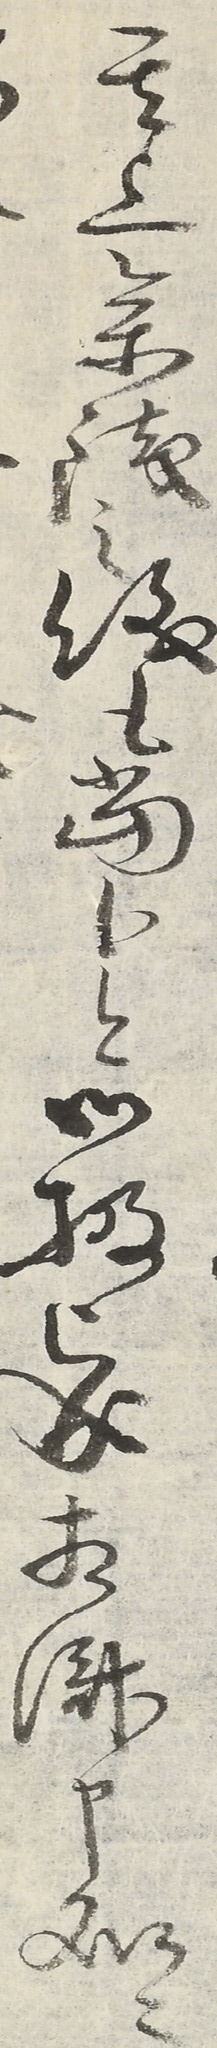其上参銭之儀も当分と御扱被成相済申処ニ
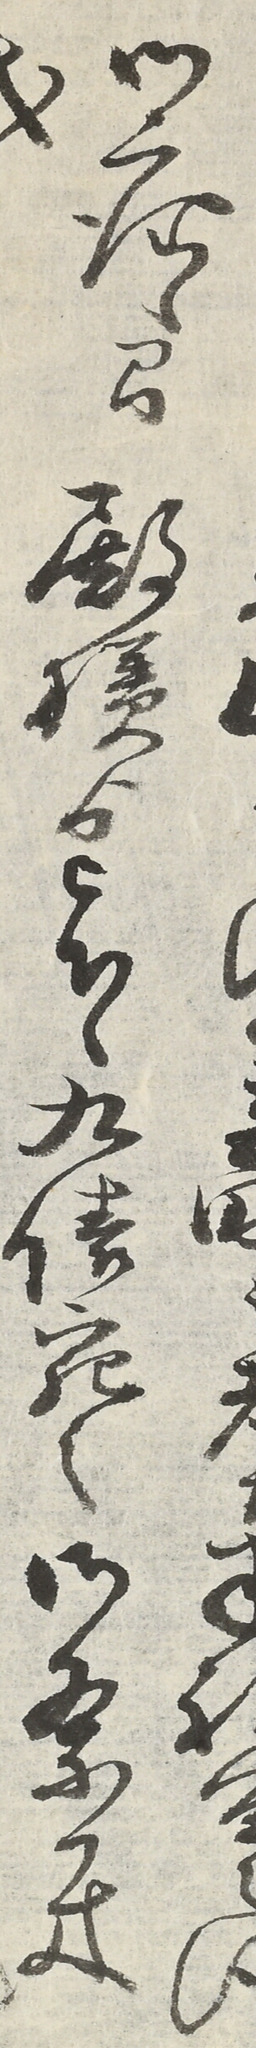御座候間殿様ゟ被下候九俵宛之御条米
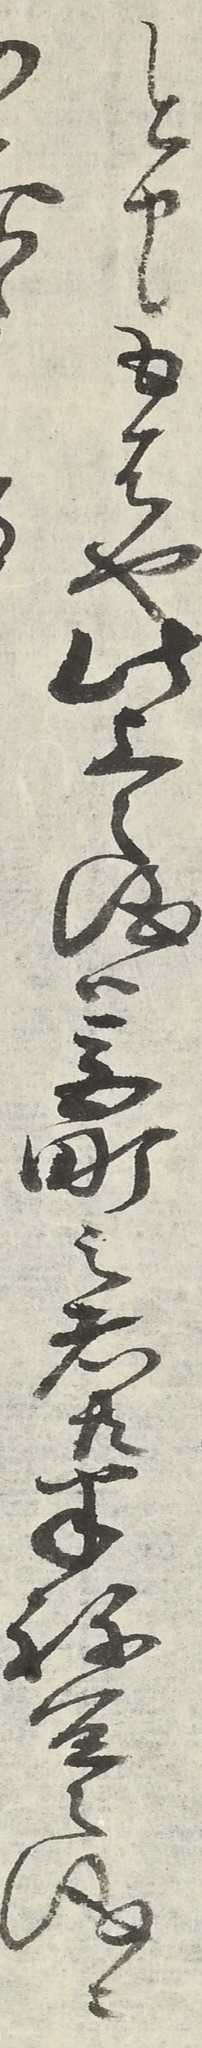と申候もはや此上之儀ハ宮町之者共半祢宜之儀ニ
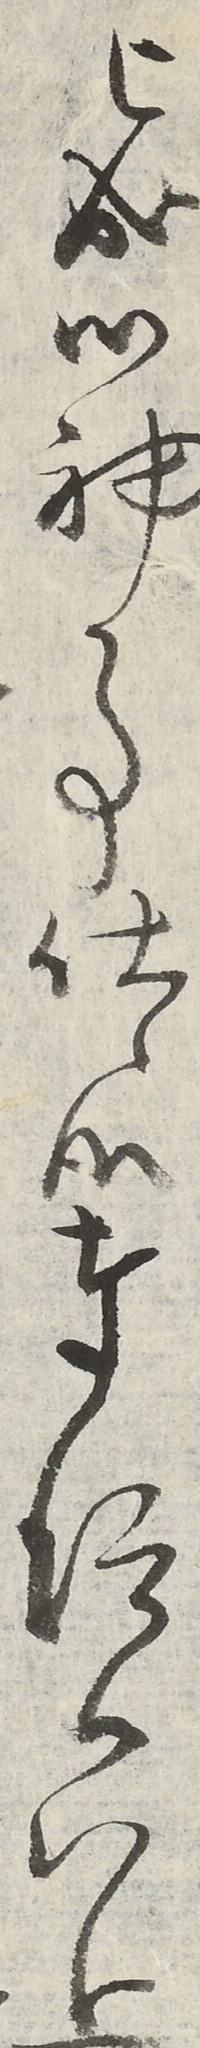被成御神事仕候様奉仰候以上
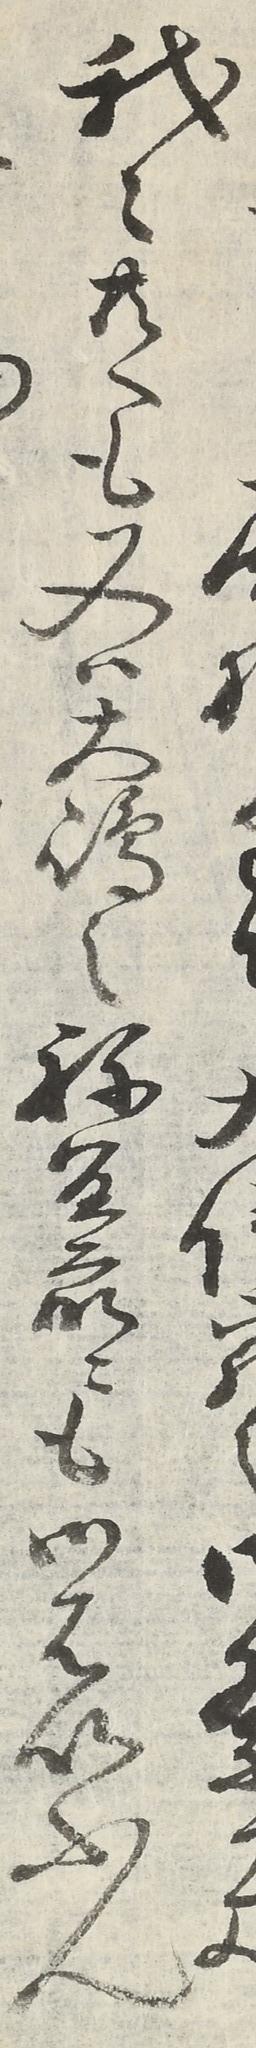我々共へも又ハ大嶋之祢宜衆ニも御はいふん
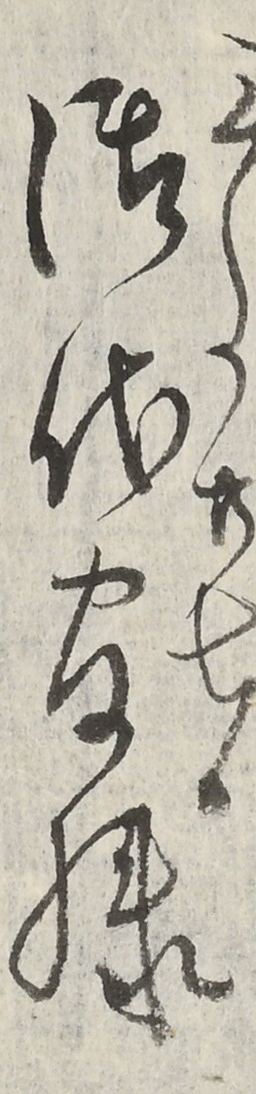御代官様

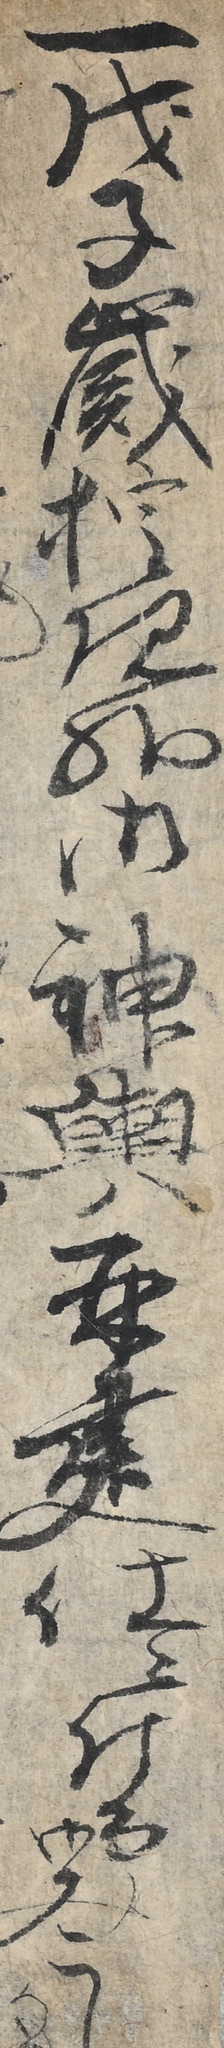一戊子歳権現様御神輿再建仕ニ付而御文こしかき
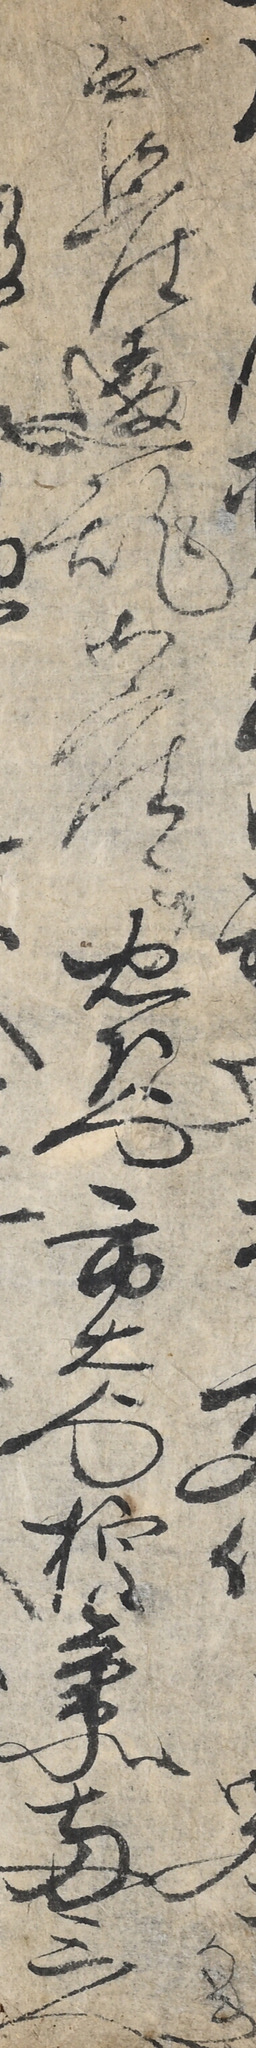無御座違乱御座候忠左衛門市右衛門権兵衛両三人
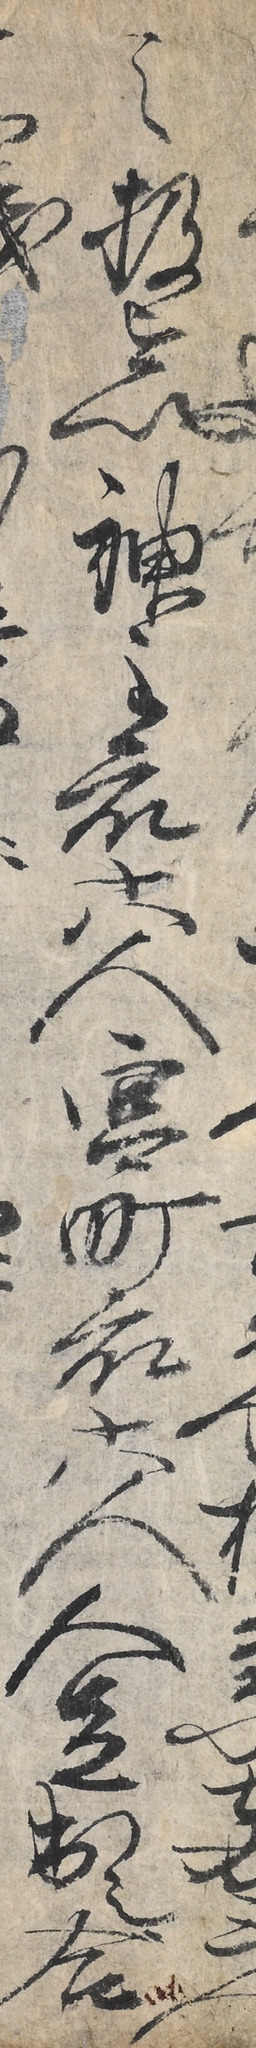之扱を以神主衆六人宮町衆六人人足出シ合
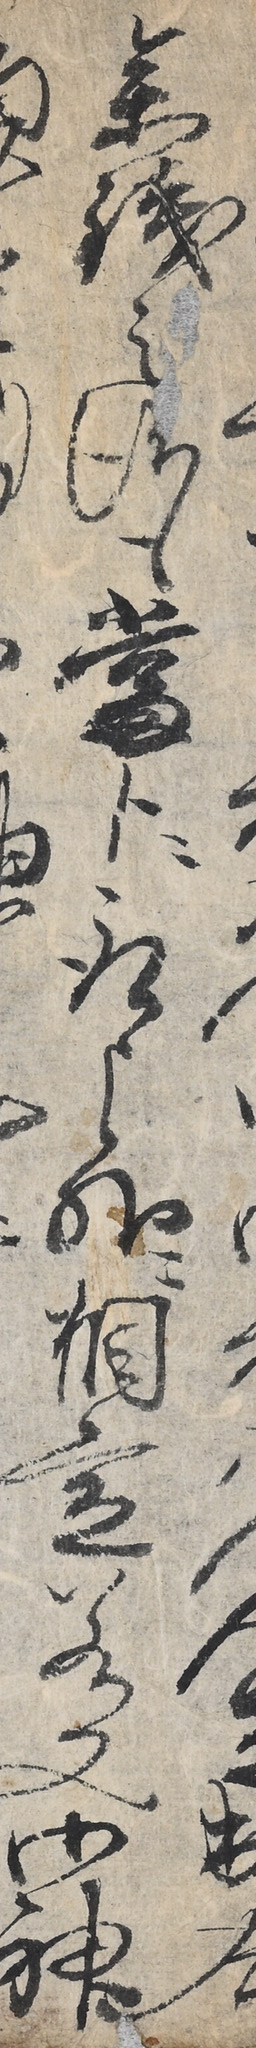参銭之儀も当分ニ取申候様ニ相定若又御神
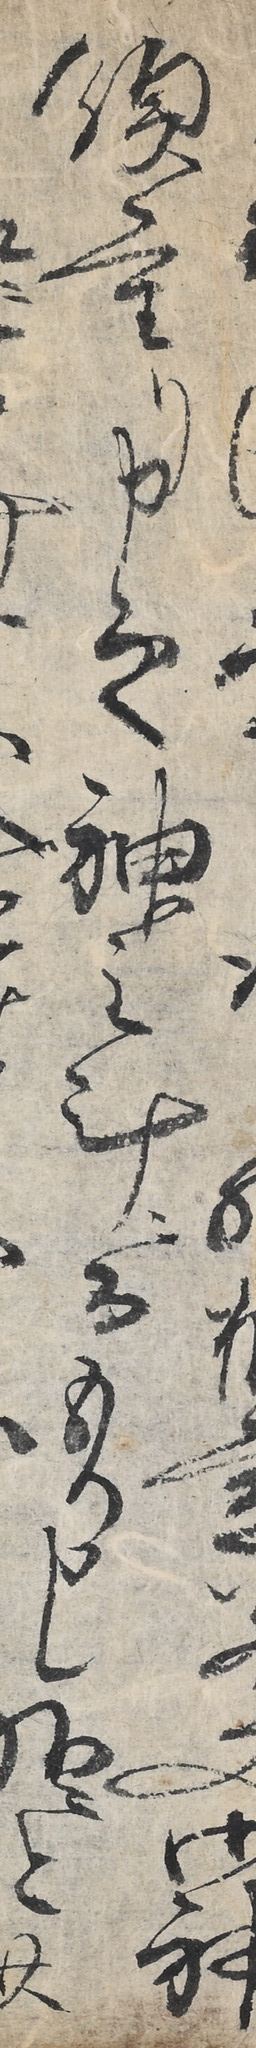領重り申候ハヽ神主計ニ而もり申候様ニと相済
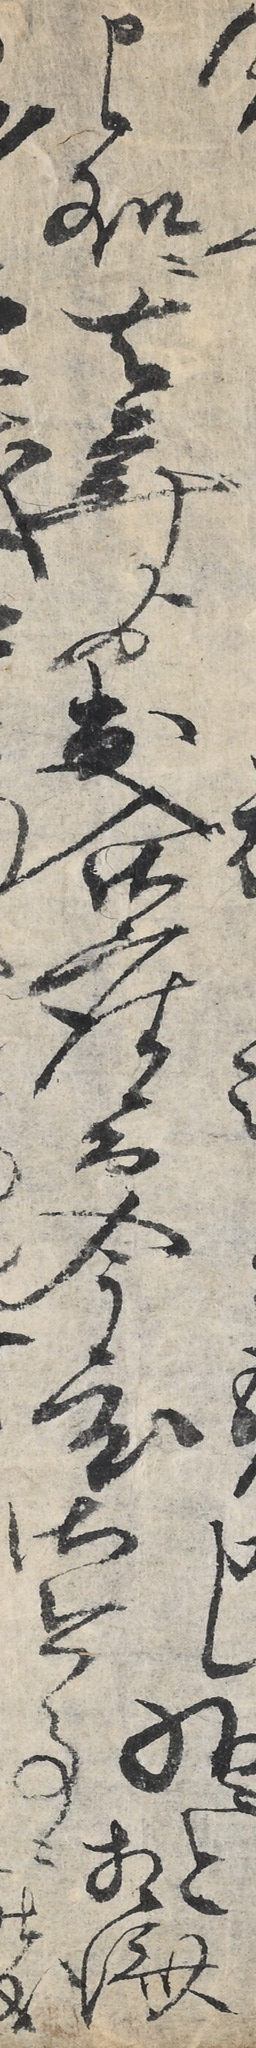申候処ニ去年ゟ出入御座候而今度御公事ニ罷成候
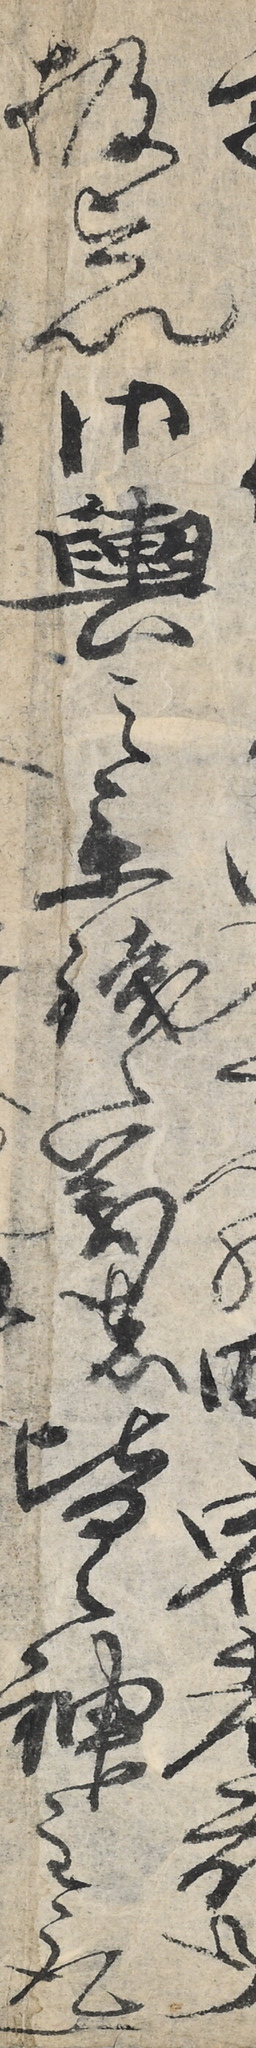扱を以御輿之参銭之義者皆々神主取候て
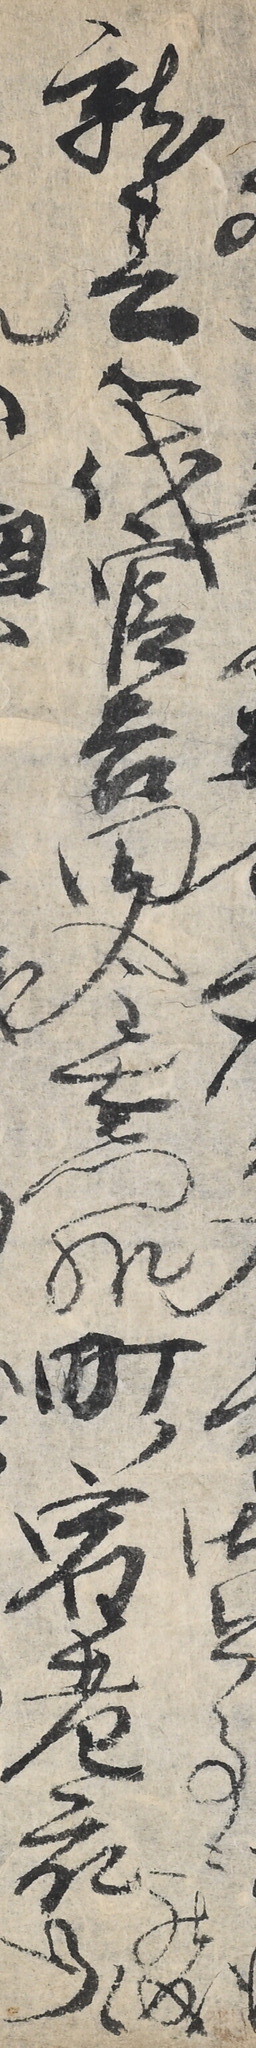就其御代官吉田金右衛門様町ノ宿老衆御
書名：旧記
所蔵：伊那市立高遠町図書館・合同会社AMANE
